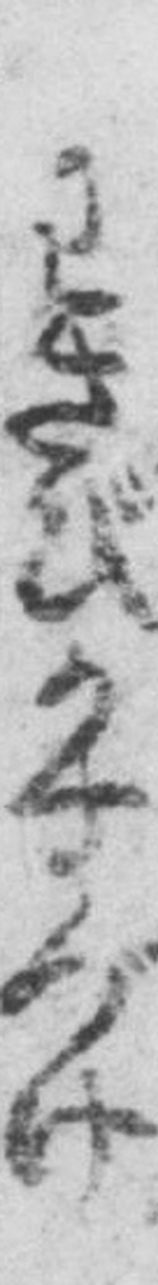わさびかすづけ
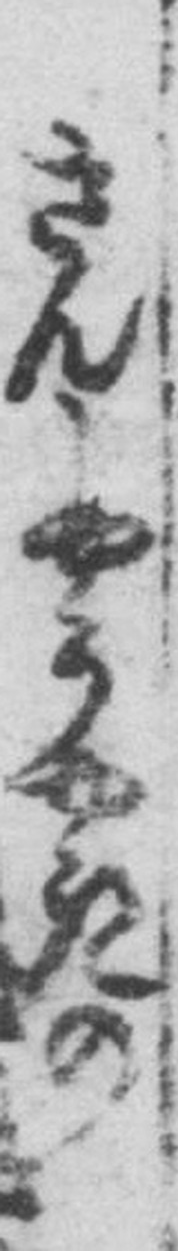きんしやうやきの
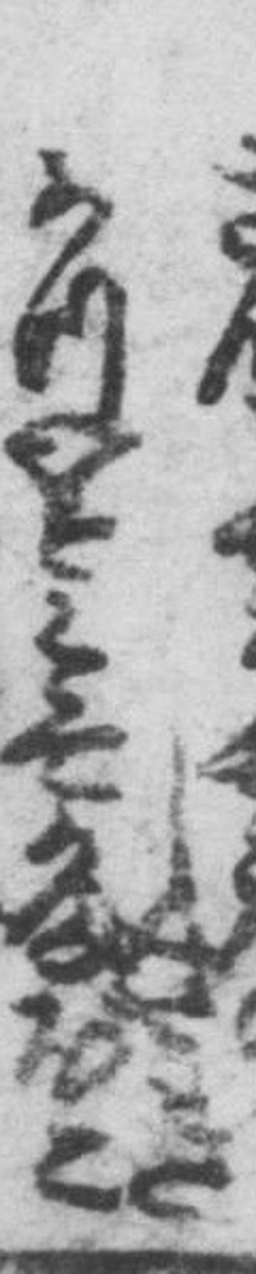七かつをミそかまぼこ
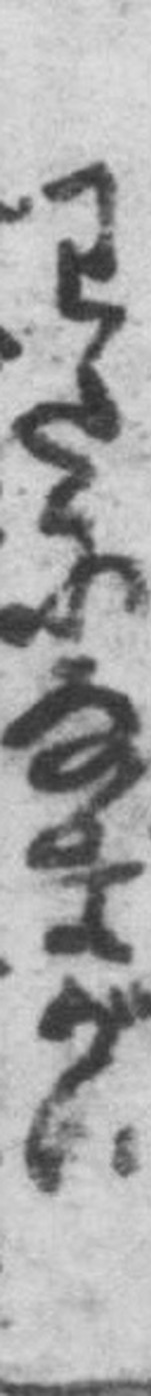わたになまがい
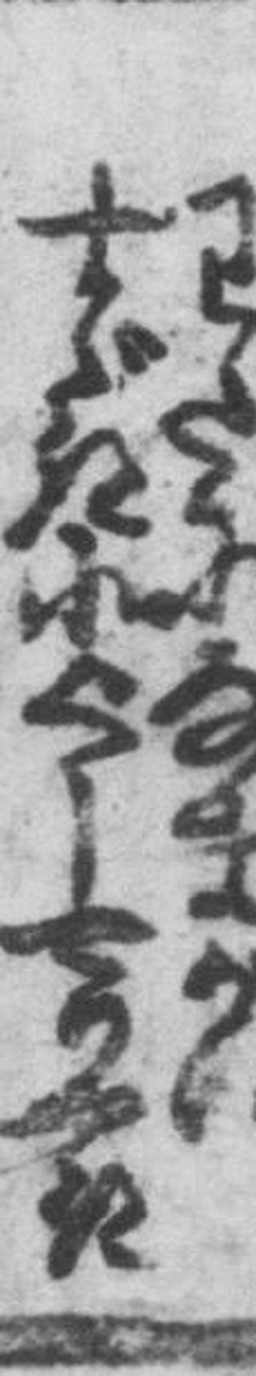色すゞき小ぐしてりやき
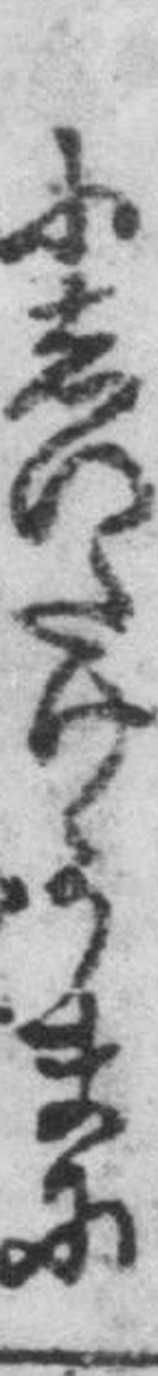小しいたけうまに
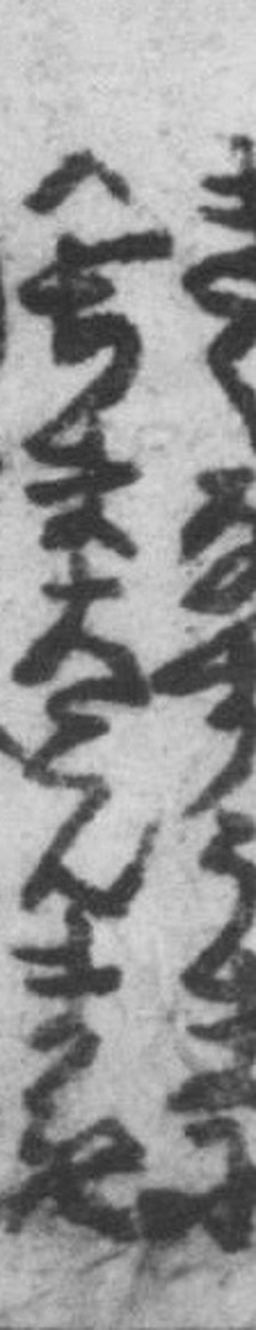へちま大こんまき
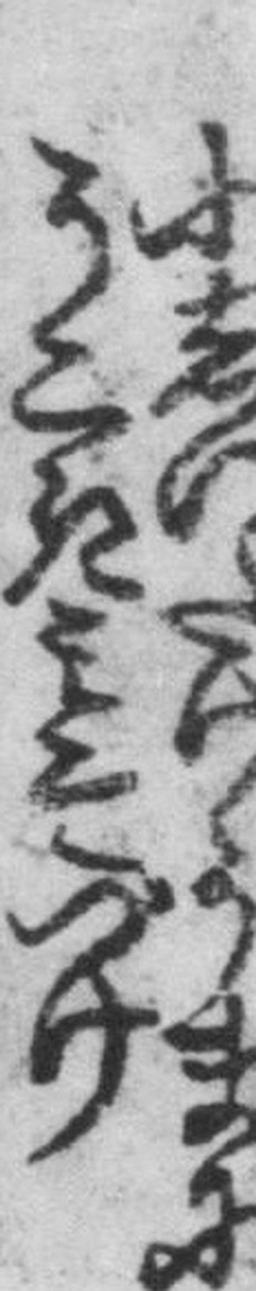うこきミそづけ
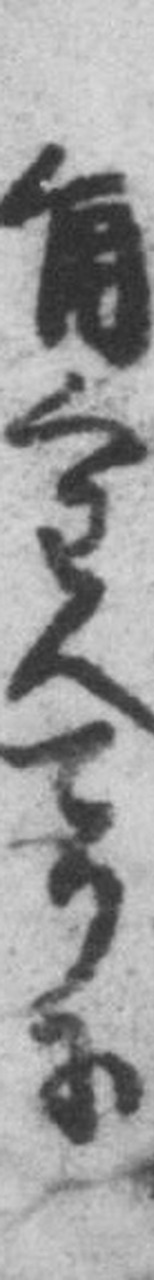角くわいてりに

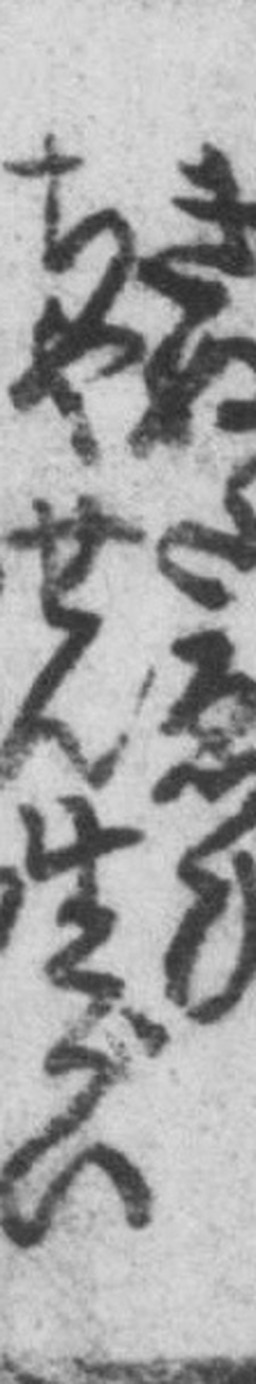ちやせん生がい
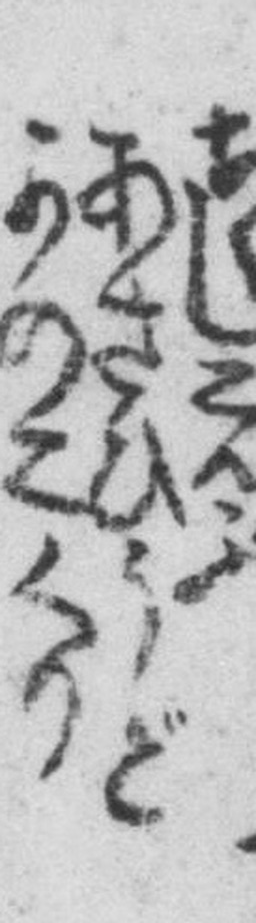かのこくり
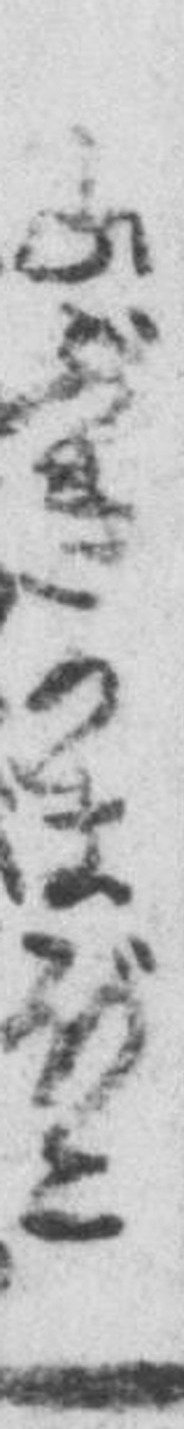山ぶきかまぼこ
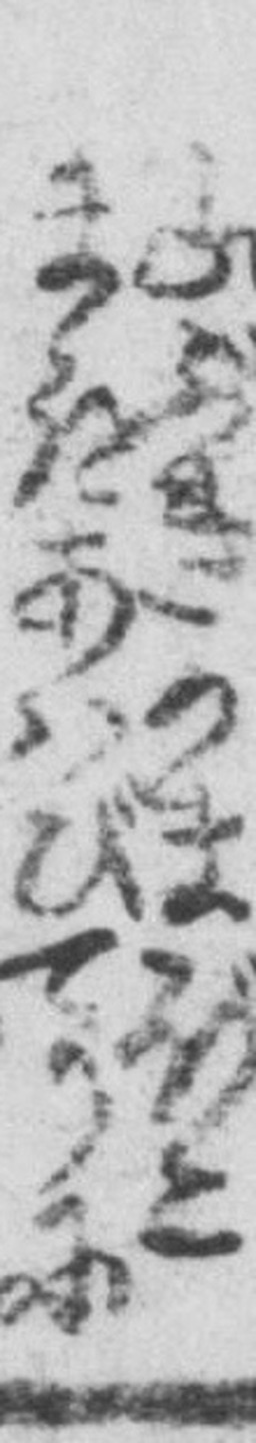まきあハびてりに
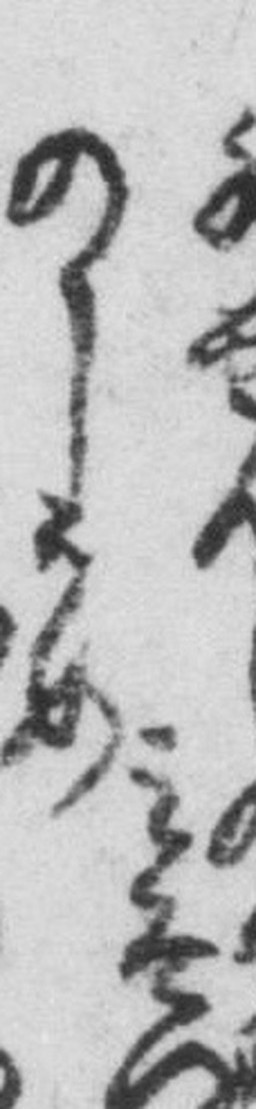のしうめ
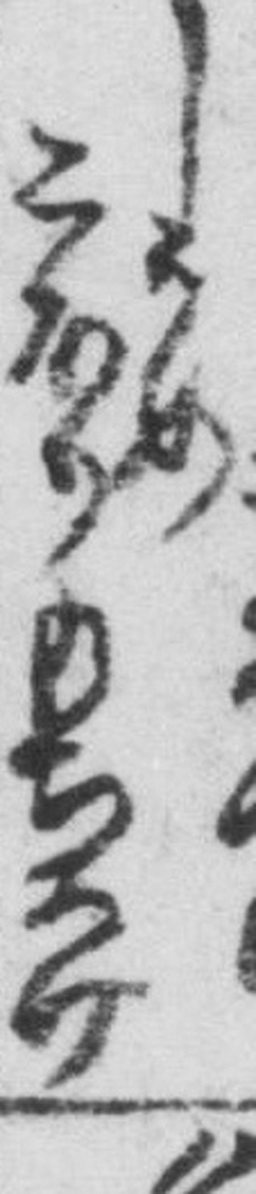こほりもちかけ
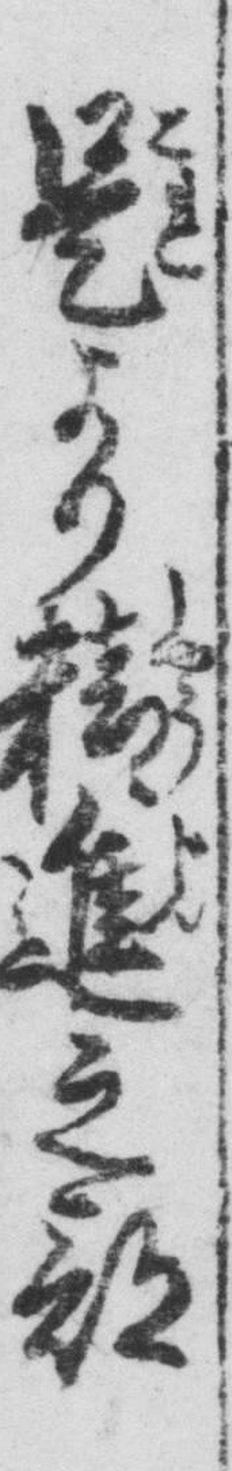是より精進之部
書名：即席庖丁
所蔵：大阪府立大学学術情報センター 国文学研究資料館
